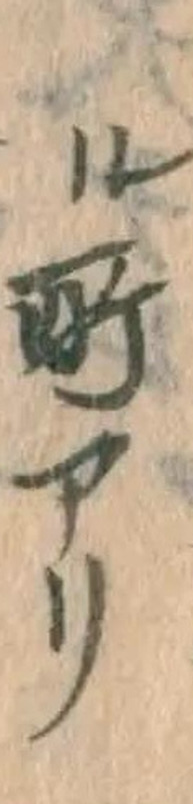ル所アリ
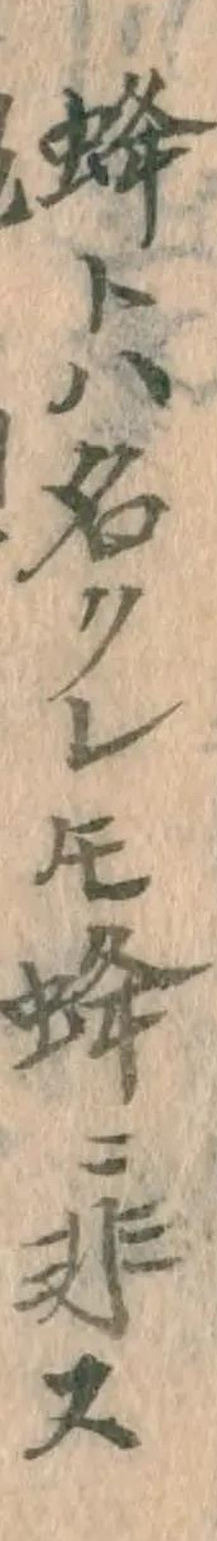蜂トハ名クレトモ蜂ニ非ス
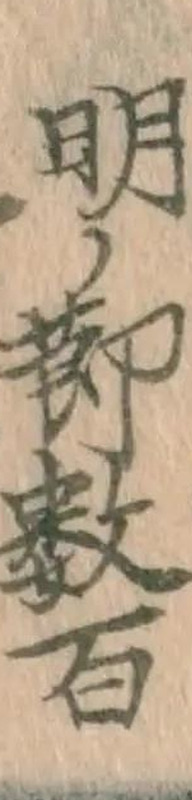明ノ節数珀
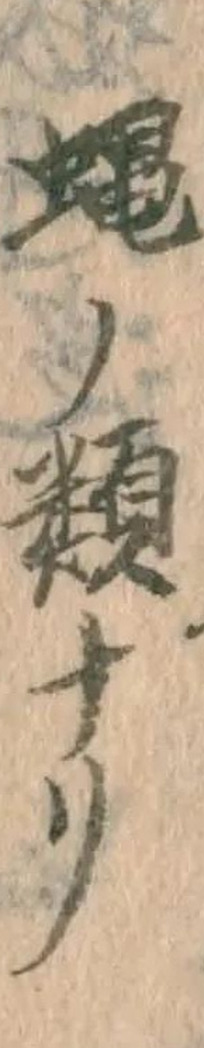蠅ノ類ナリ
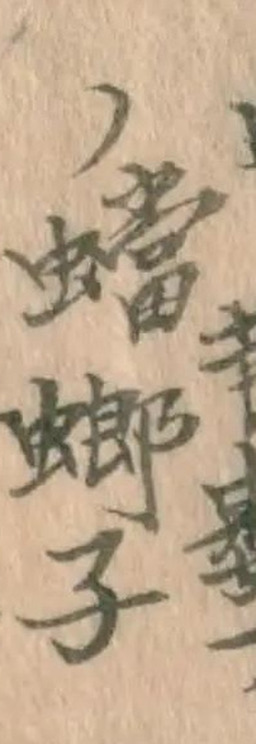ノ蟷螂子
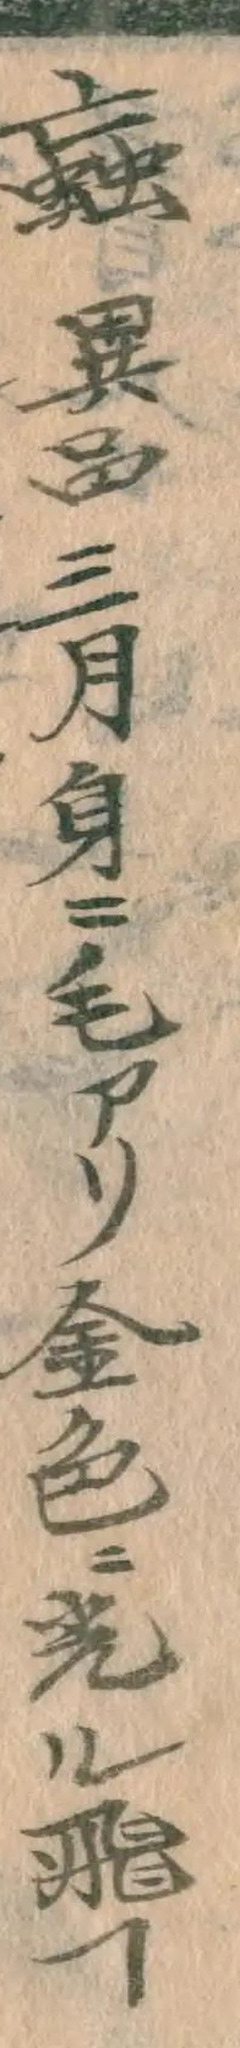蝱異品三月身ニ毛アリ金色ニ光ル飛コト
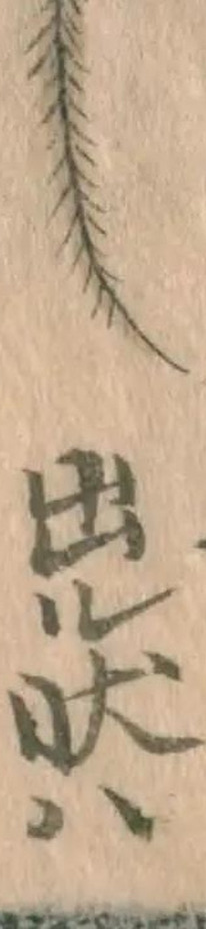出ル状ハ
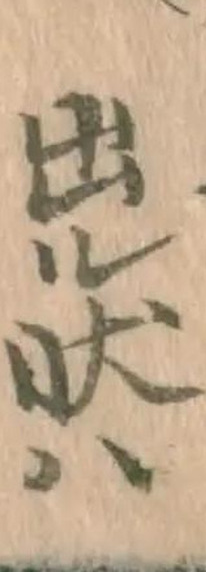出ル状ハ
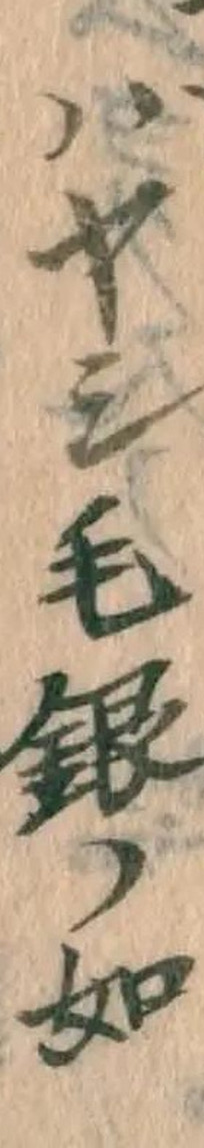ハヤシ毛銀ノ如
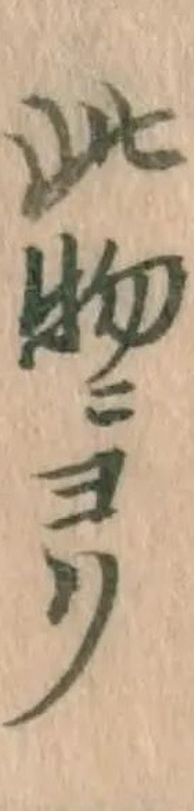此物ニヨリ
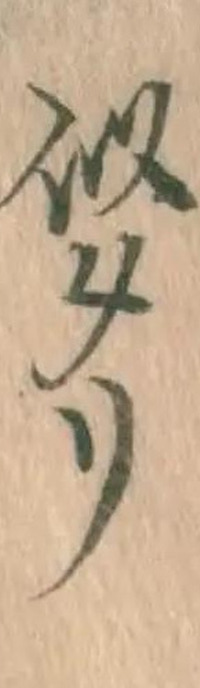似タリ
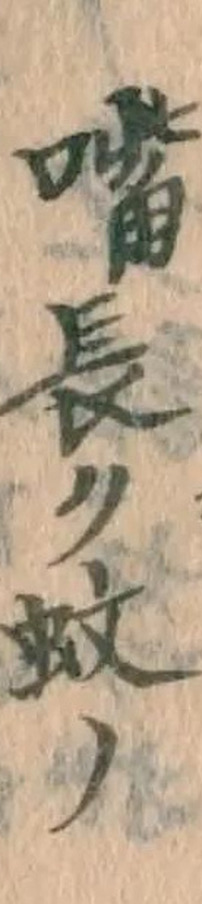嘴長ク蚊ノ
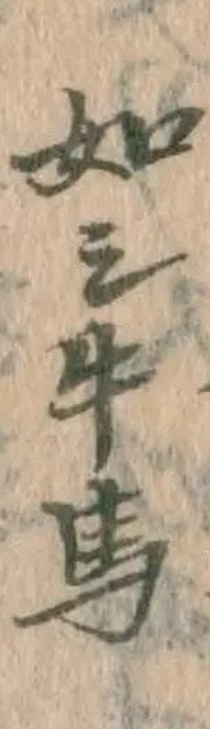如シ牛馬
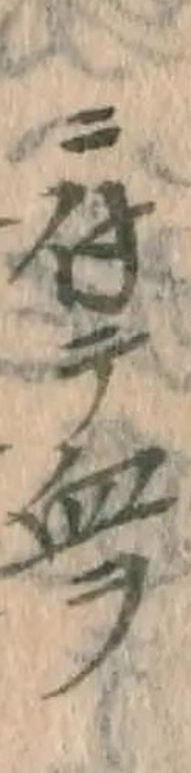ニ付テ血ヲ
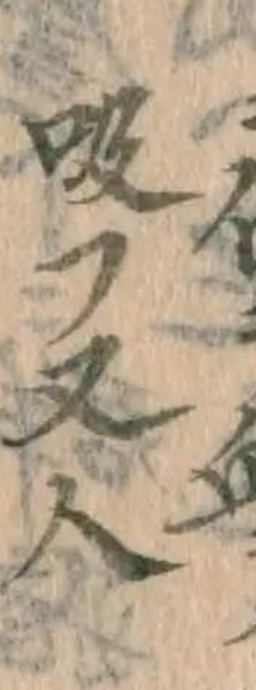吸フ又人
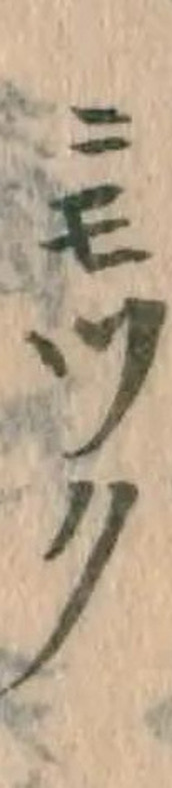ニモツク
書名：千蟲譜 3巻. [3]
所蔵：国立国会図書館 National Diet Library, JAPAN
